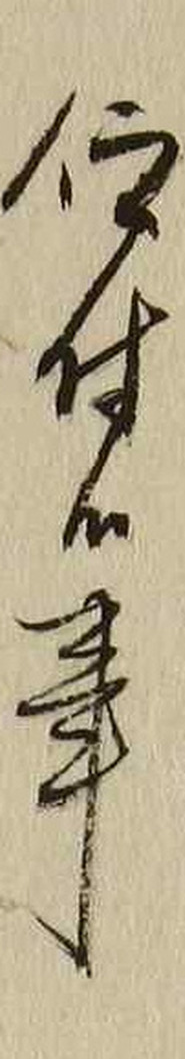仰付候事
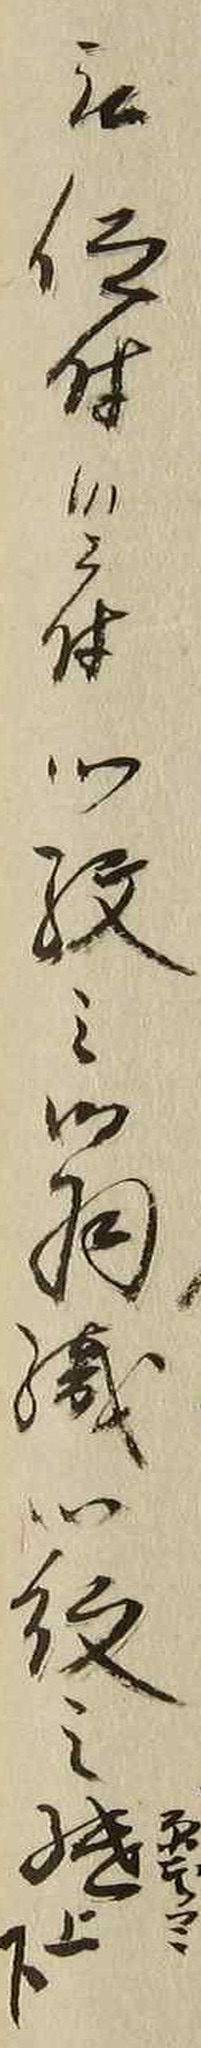被仰付候ニ付御紋之御羽織御紋之継上下
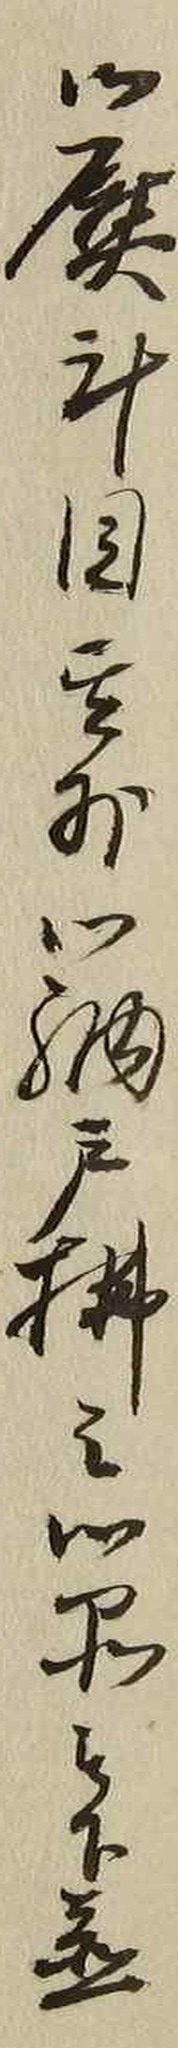御熨斗目其外御納戸払之御品被下置
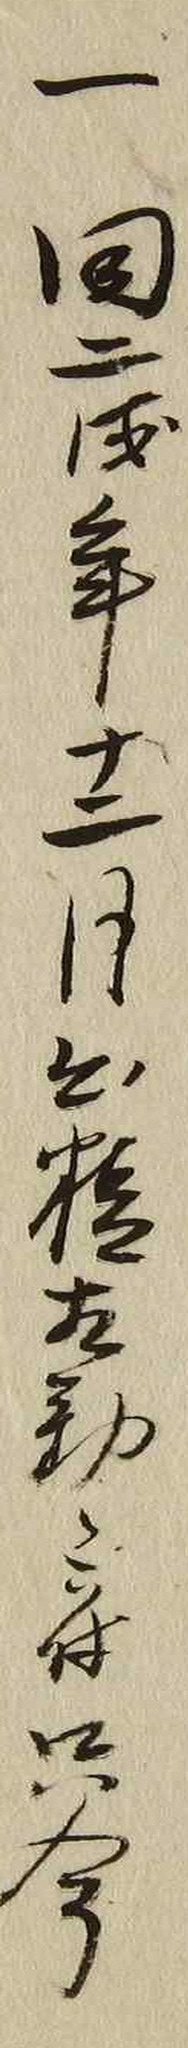一同二戌年十二月出精相勤候ニ付只今
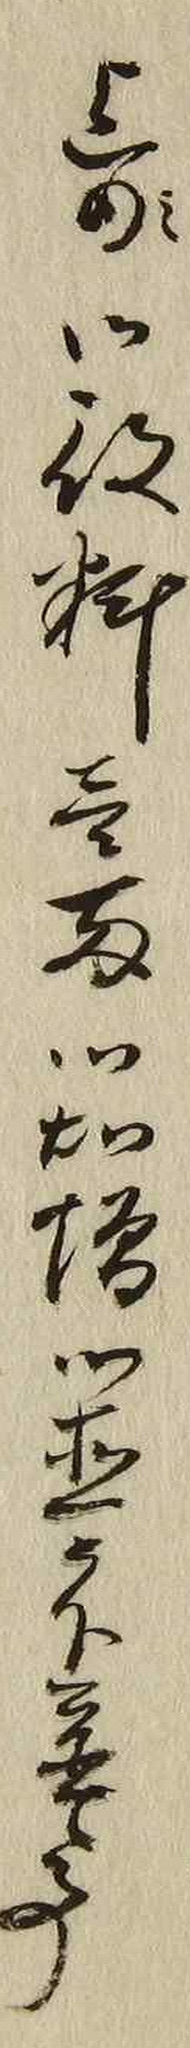迄の御役料壱両御加増御直被下置候事
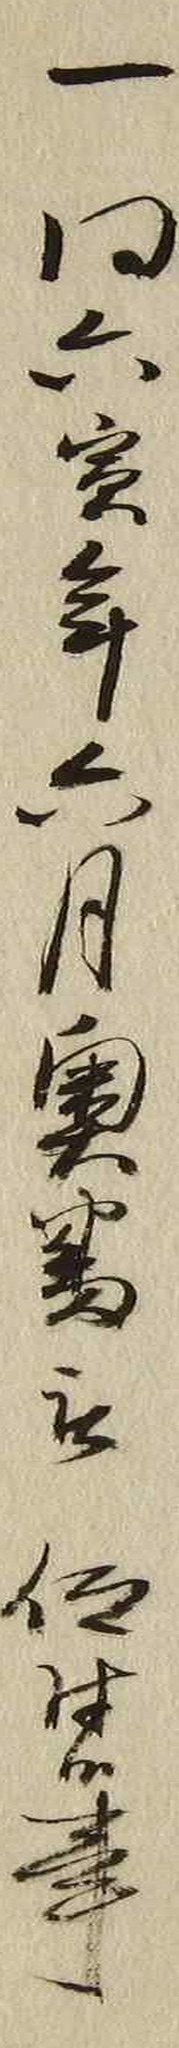一同六寅年六月奥番被仰付候事
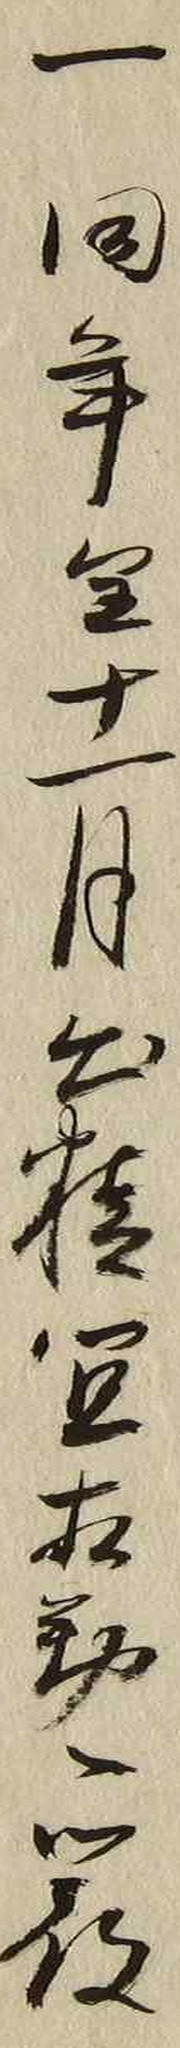一同年閏十一月出精宜相勤候御役
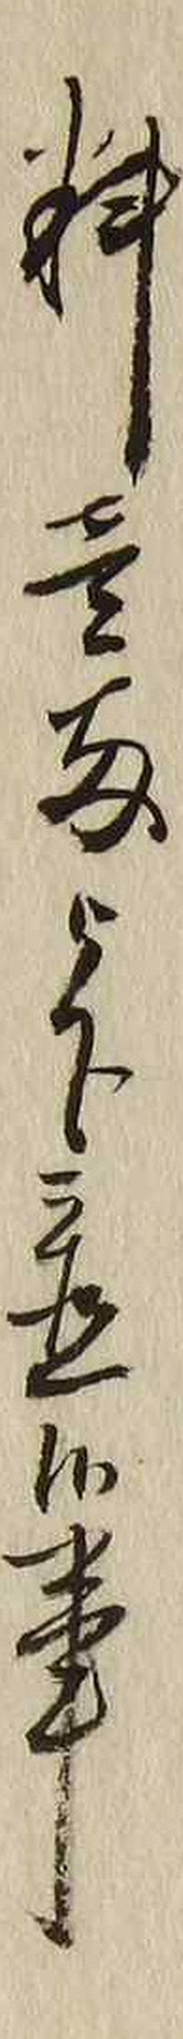料壱両被下置候事
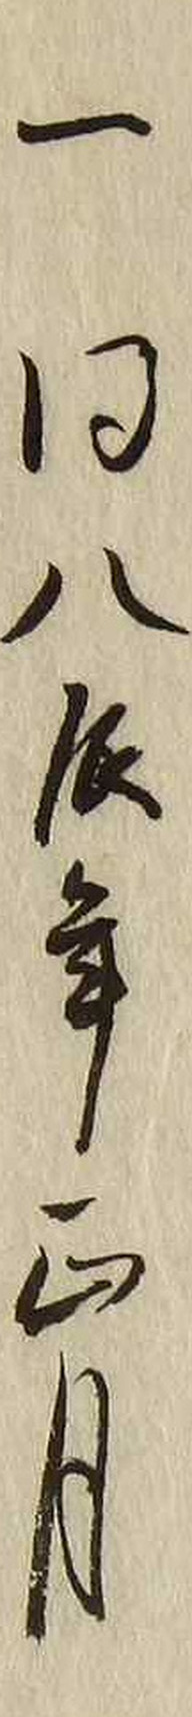一同八辰年正月
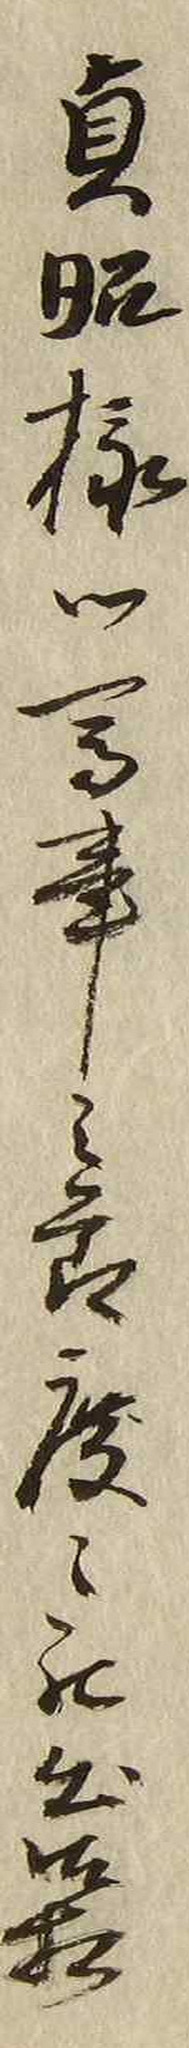貞昭様御馬事之節度々罷出御相

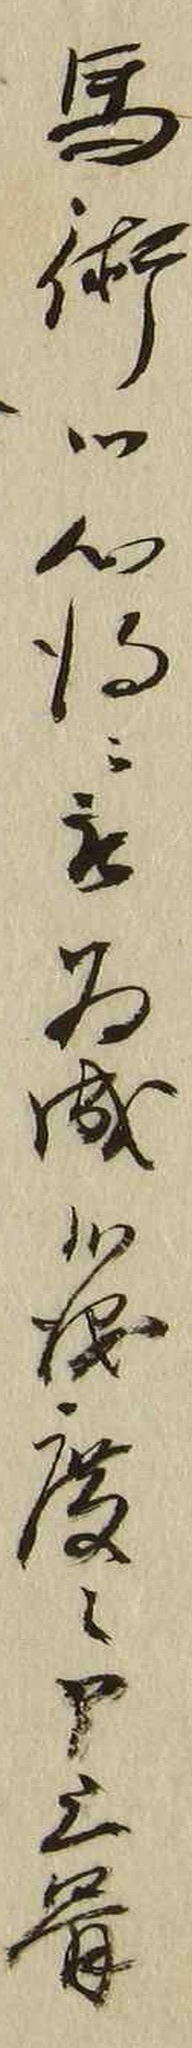馬術御心得ニ被為成候儀度々申上骨
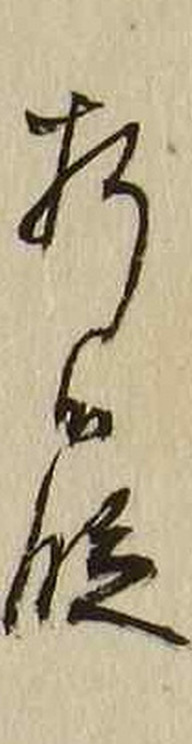折候段
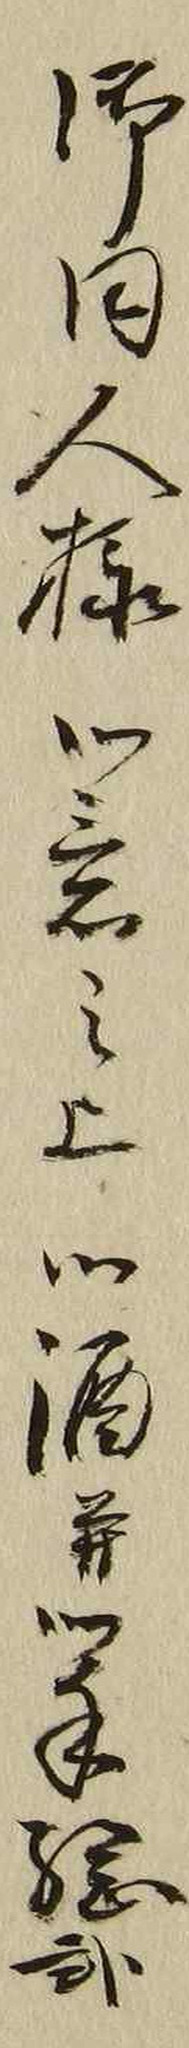御同人様御意之上御酒并御手綱弐
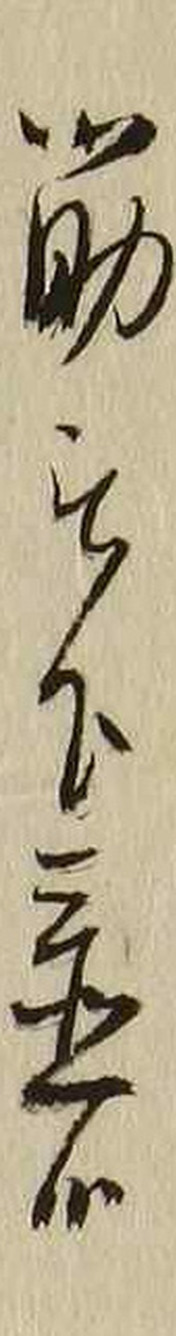筋被下置候
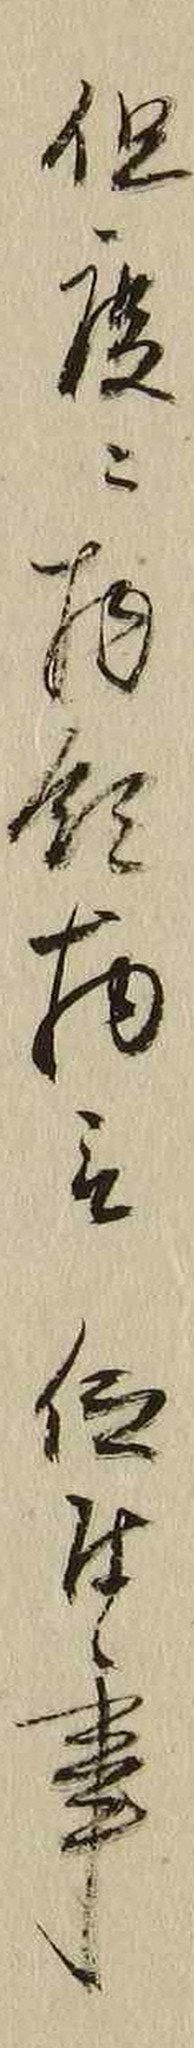但度々拝領物被仰付候事
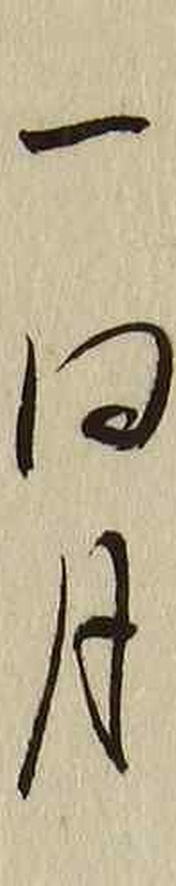一同月
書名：諸士系譜　巻之345　も之部1
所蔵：会津若松市立会津図書館
